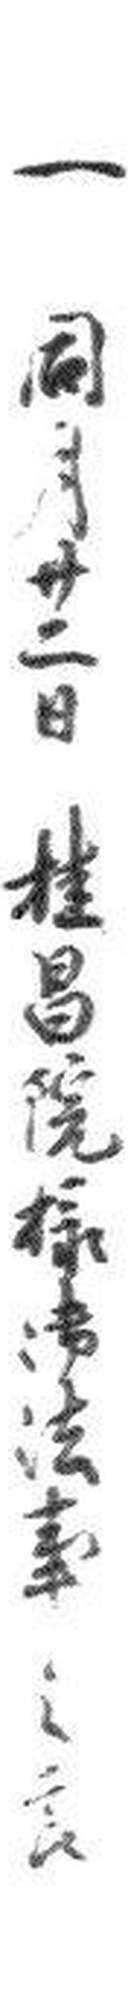一同月廿二日桂昌院様御法事之節
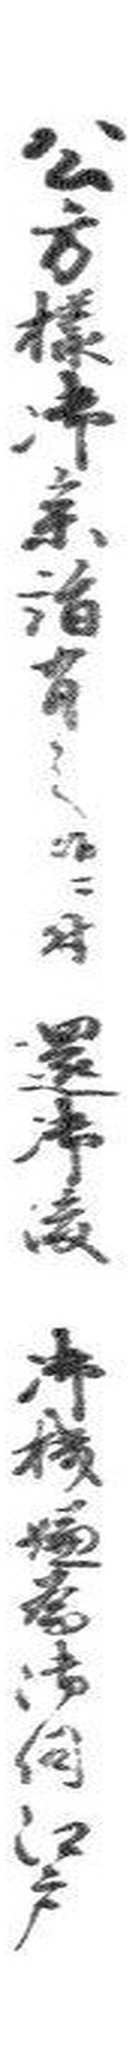公方様御参詣有之候ニ付還御後御機嫌為御伺江戸
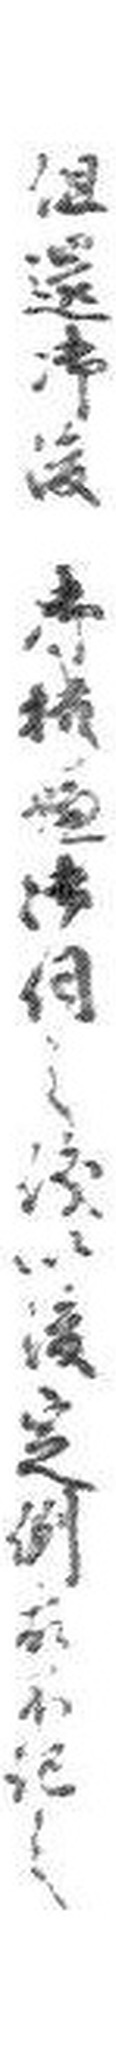但還御後渡御機嫌御伺之儀以後定例故不記之
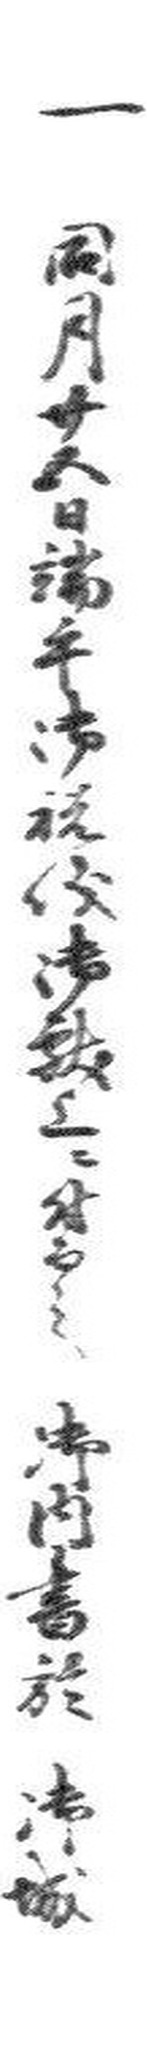一同月廿五日端午御祝儀御献上ニ付而之御内書於御城

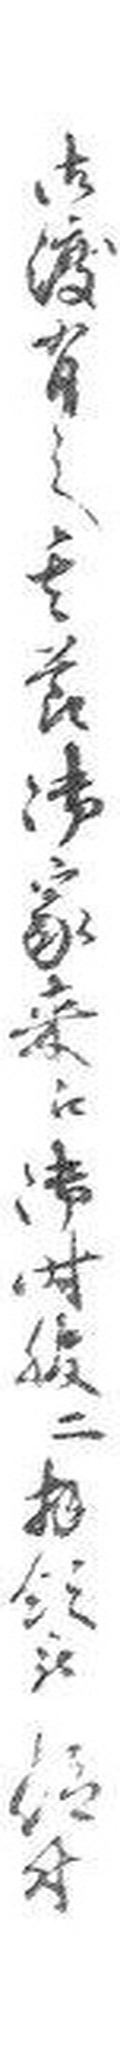御渡有之其節御家来江御時服ニ拝領被仰付
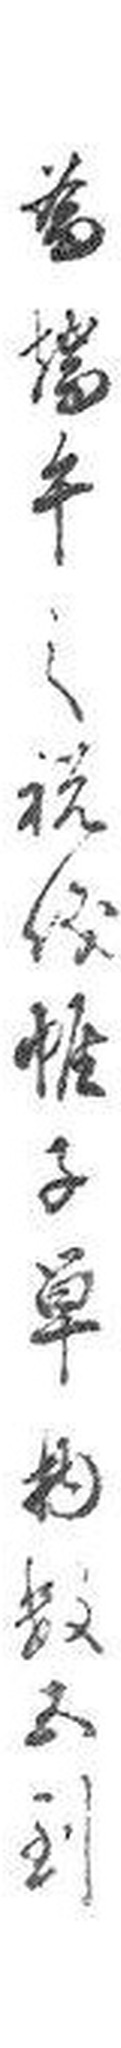為端午之祝儀帷子単物数五到
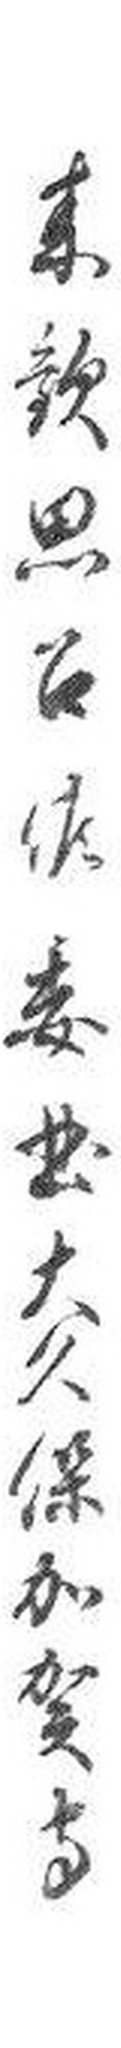来歓思召候委曲大久保加賀守
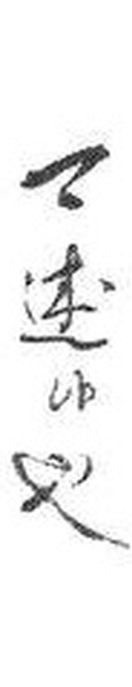可述候也
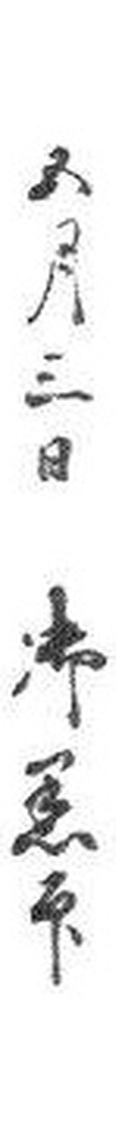五月三日御黒印
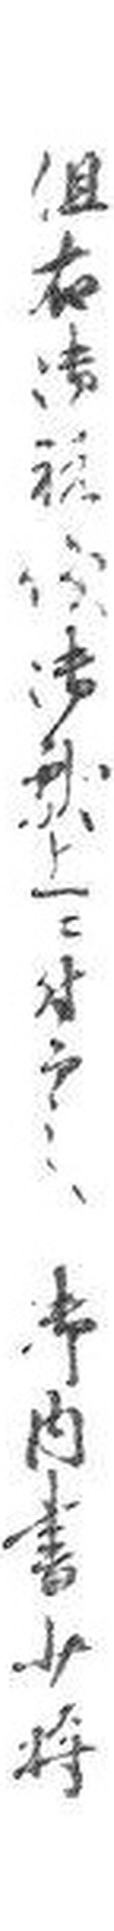但御祝儀御献上ニ付而之御内書少将
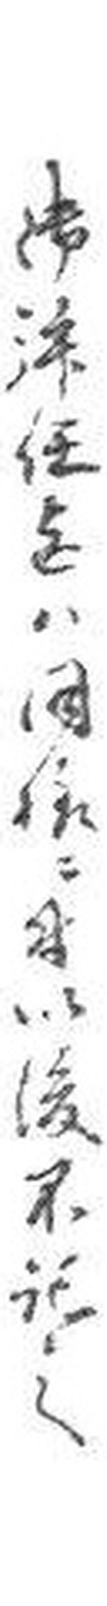御拝任迄ハ同様ニ付以後不記之
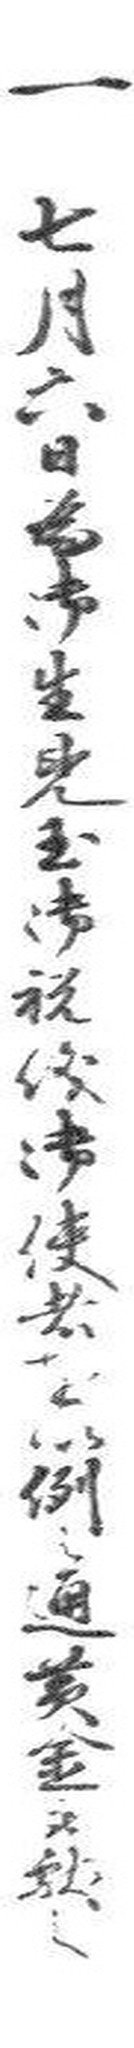一七月六日為御生見玉御祝儀御使者を以例之通黄金被献之
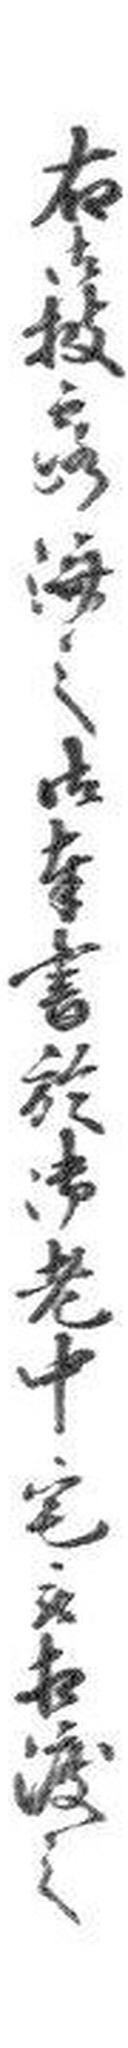右御披露済之御奉書於御老中宅被相渡之
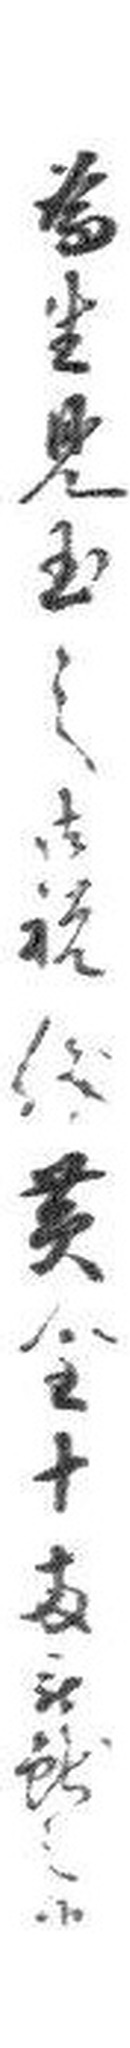為生見玉之御祝儀黄金十両被献之候
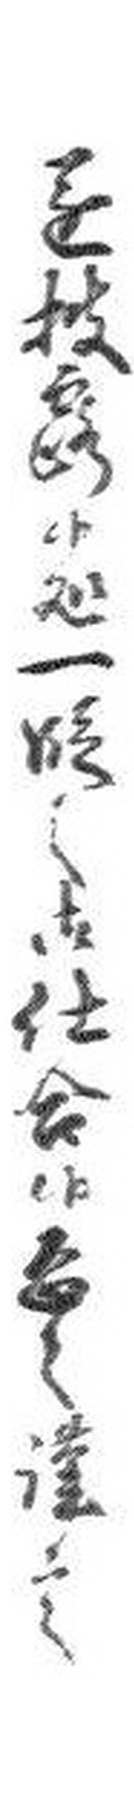遂披露候処一段之御仕合候恐々謹言
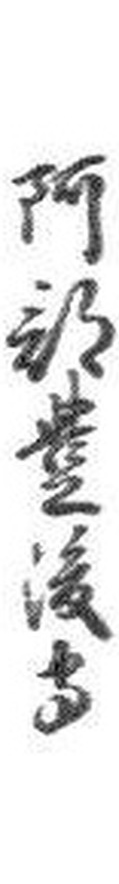阿部豊後守
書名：家譜 二十八 吉邦公 従宝永七年七月五日到正徳元年十二月
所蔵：福井県文書館 Fukui Prefectural Archives
